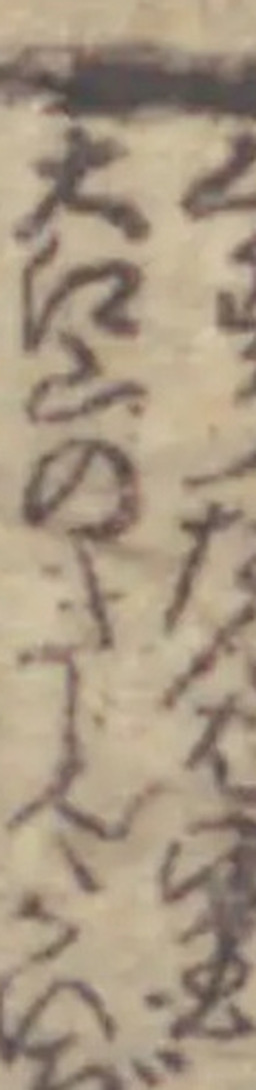大江山のきじんたいぢ
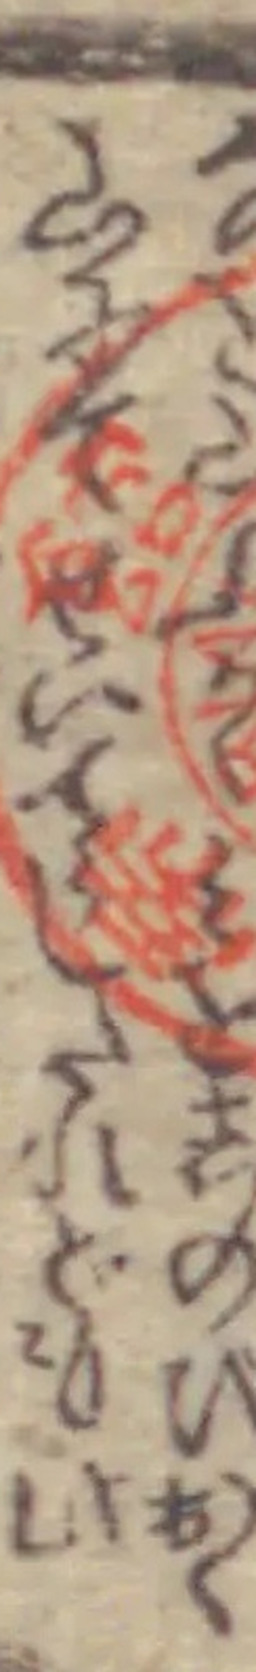山にてせいてうしたれども此
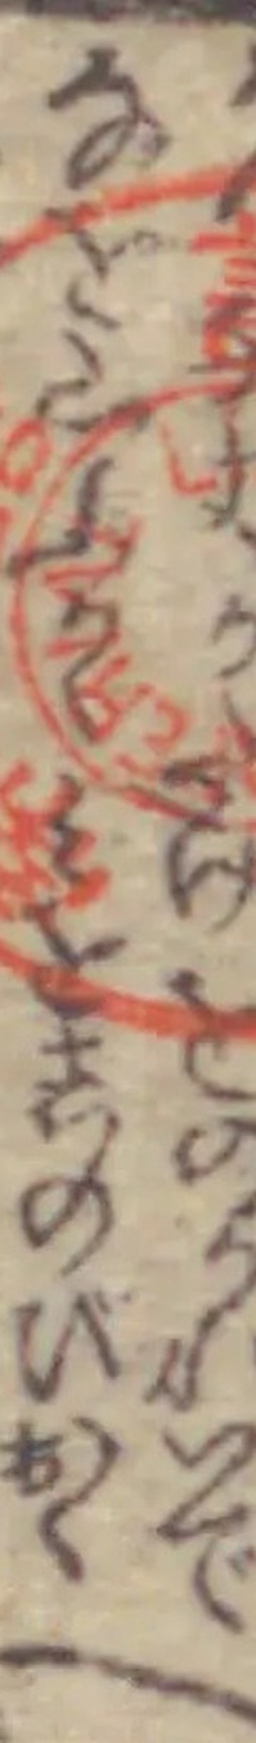なを山ふかくみをしのびおく
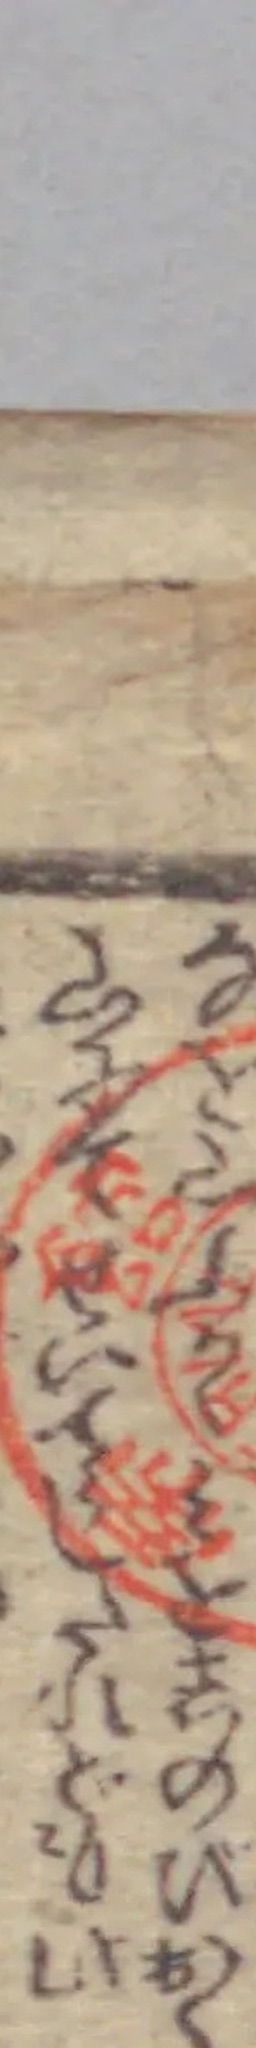山にてせいてうしたれども此
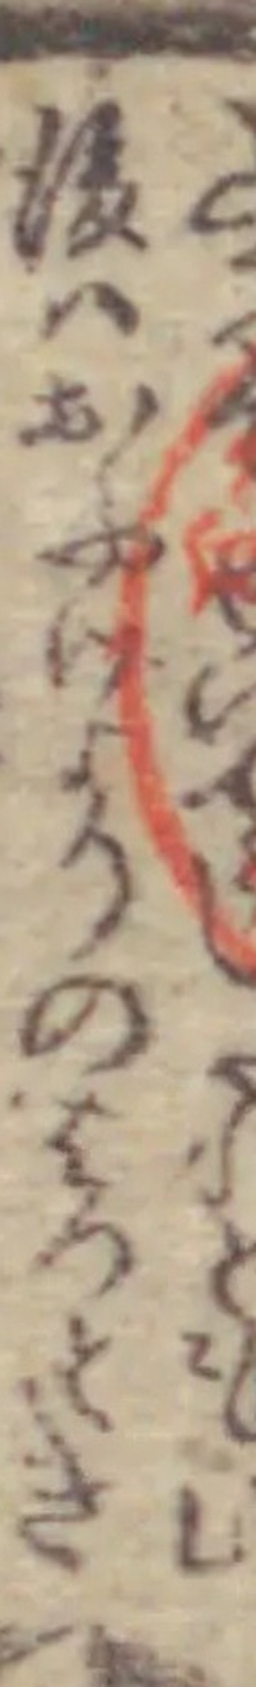後はおゝやけよりのはつとき
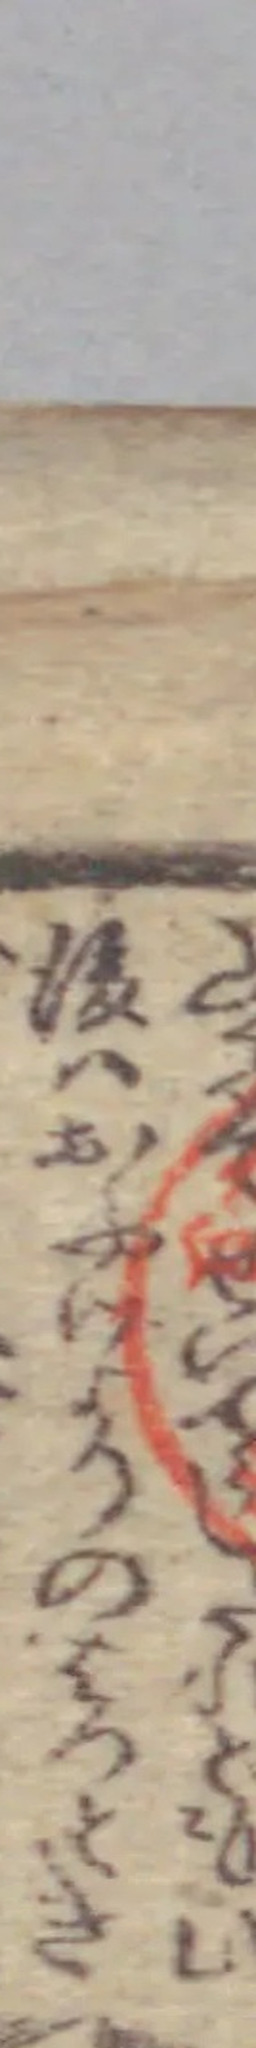後はおゝやけよりのはつとき
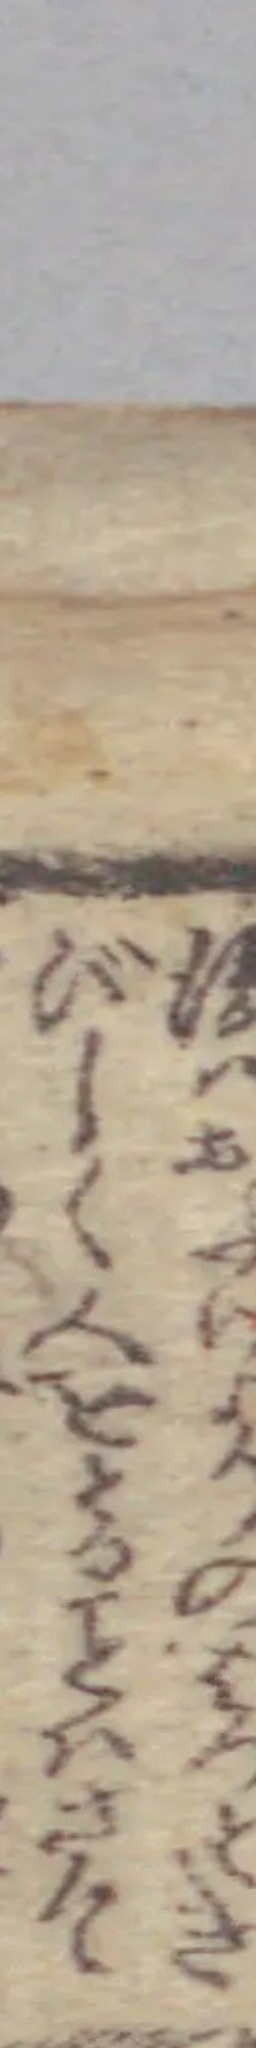びしく人をとることはさて
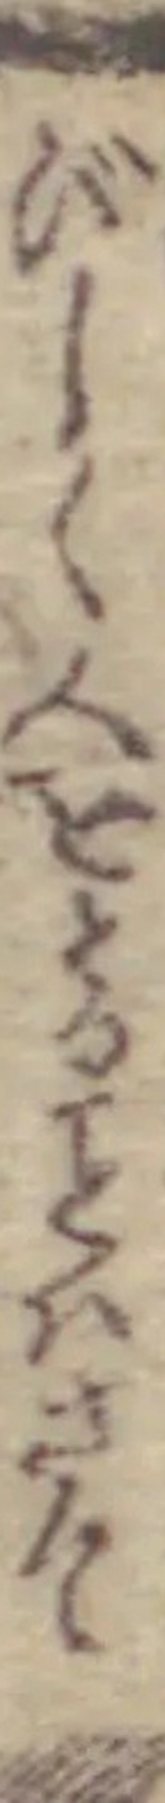びしく人をとることはさて
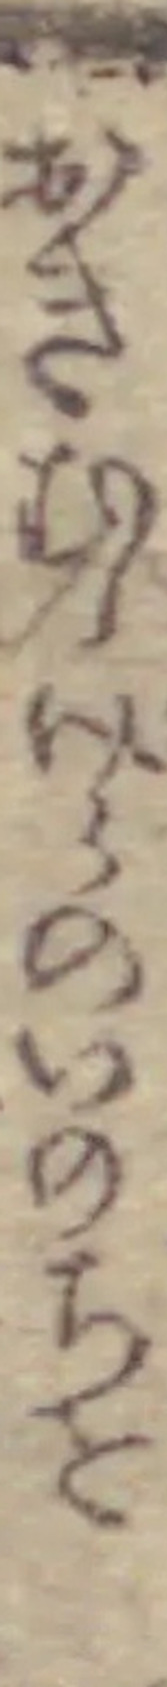おきむしけらのいのちを
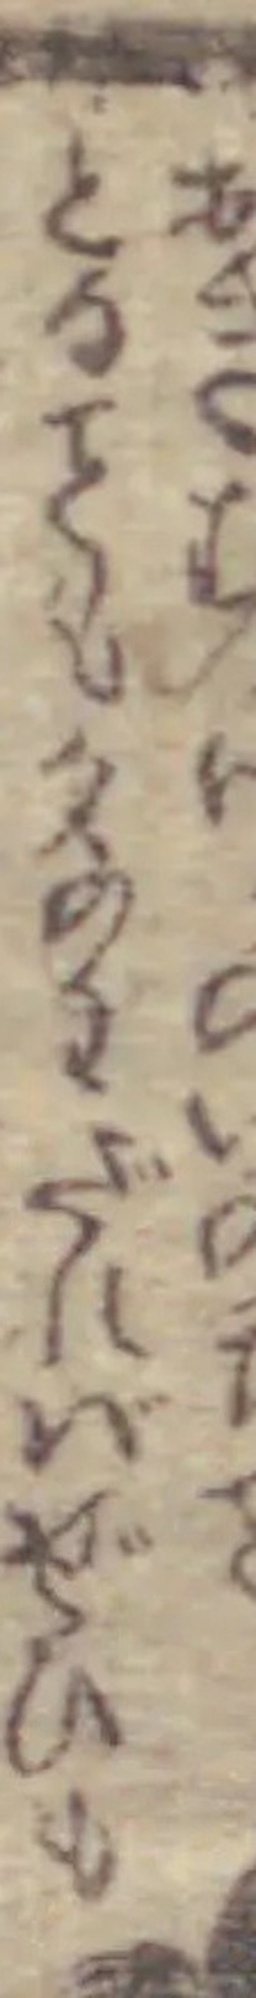とることもかのわざればぜひも
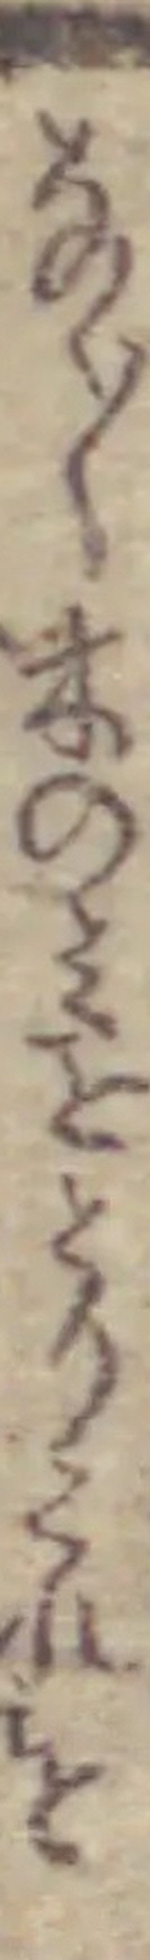なく〳〵木のみをとりこれを
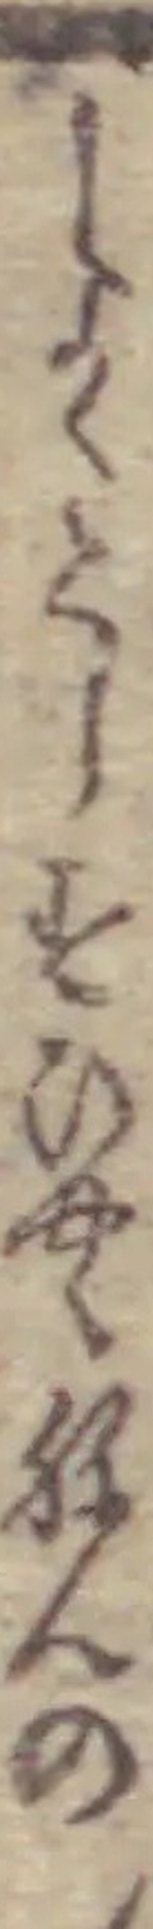しよくとしすひやくねんの
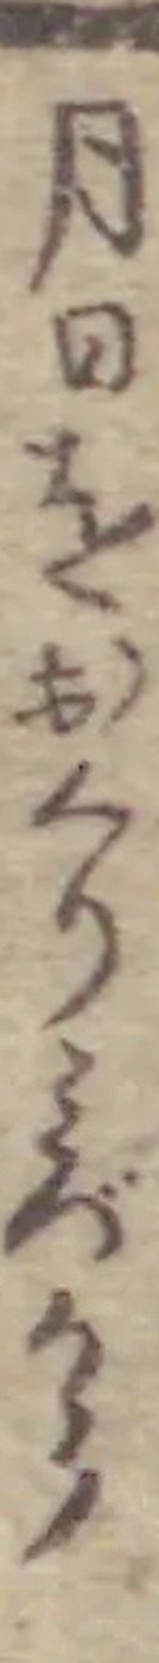月日をおくりみづから
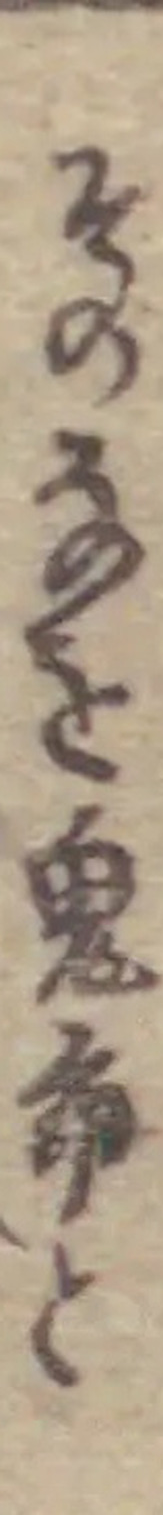そのなを鬼市と
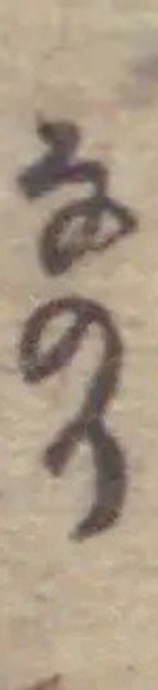なのり
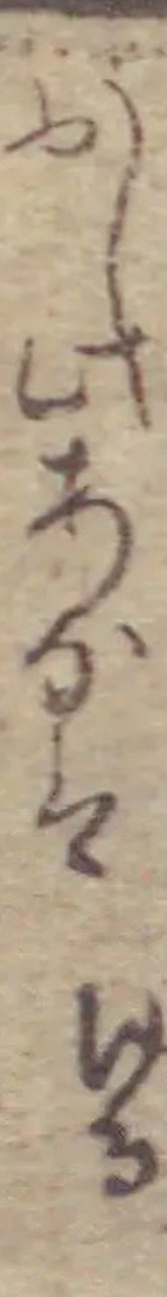かし此あなは
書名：鬼子宝 3巻
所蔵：国立国会図書館 National Diet Library, JAPAN
